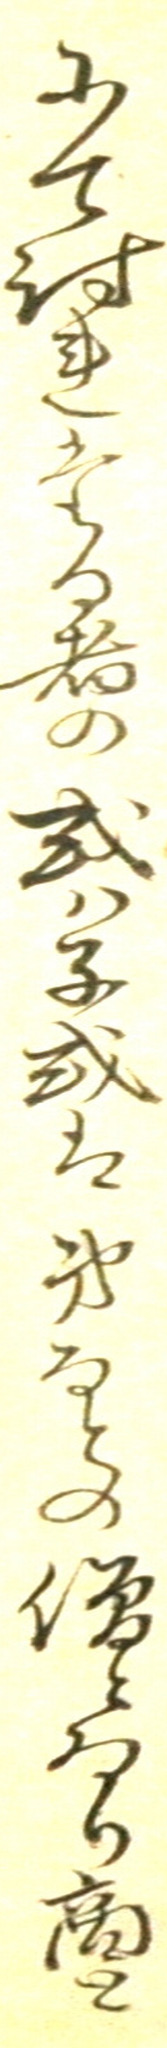にて討れたる者の或は子或は弟なとの僧となり商と
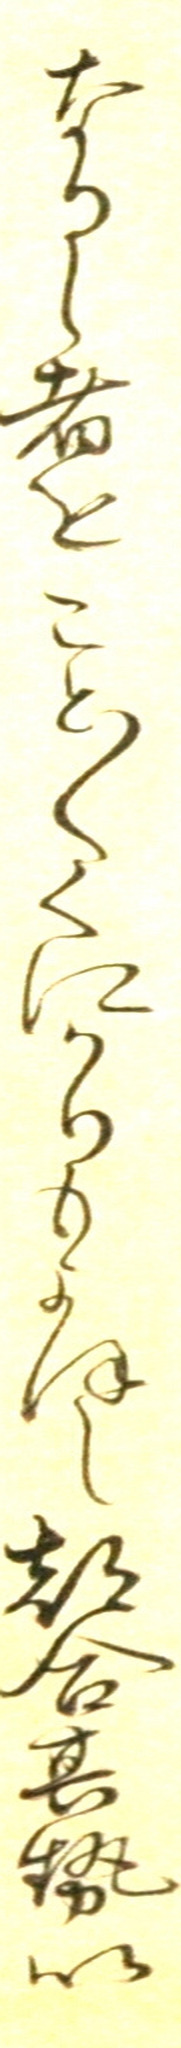なりし者をこと〳〵くにかりもよほし都合其せい

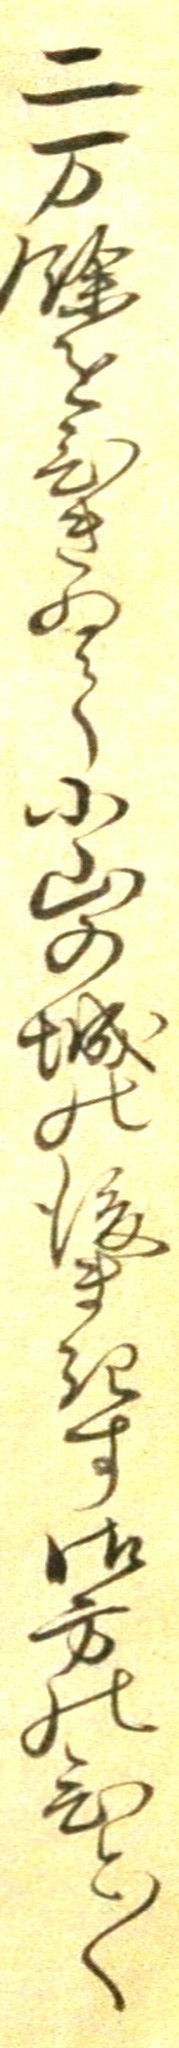二万余をひきゐて小山の城の後まきす御方のひと〳〵
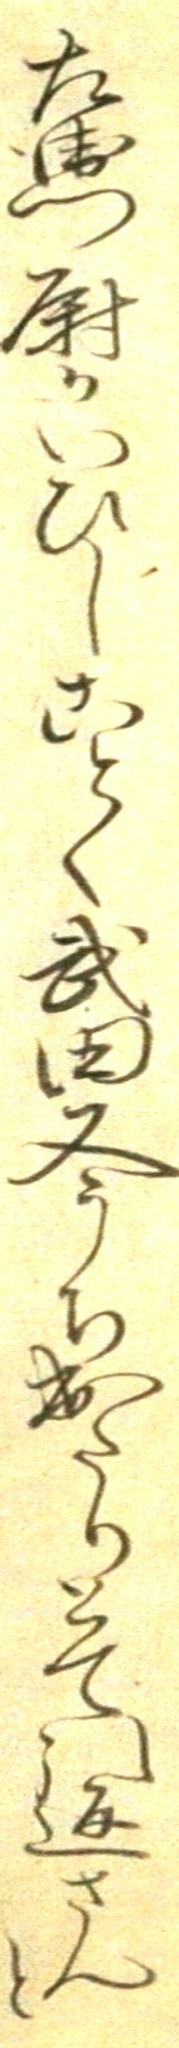左衛門尉かいひしことく武田又うち出たりとて引返さんと
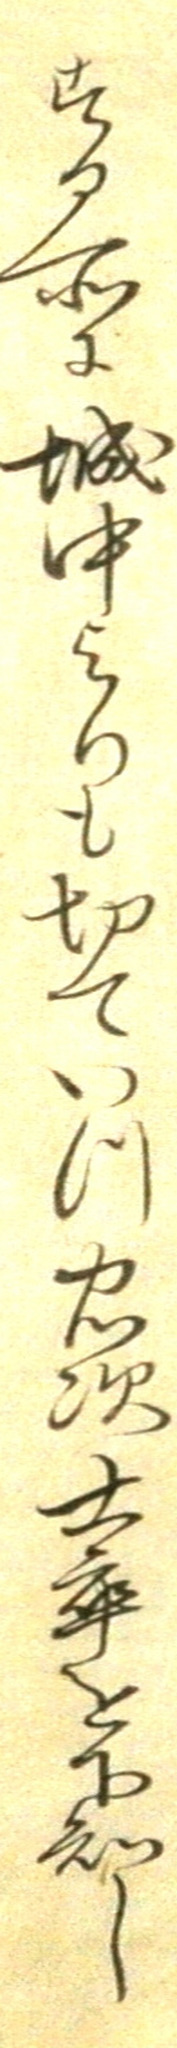する所に城中よりも切ていつ忠次士卒を下知し
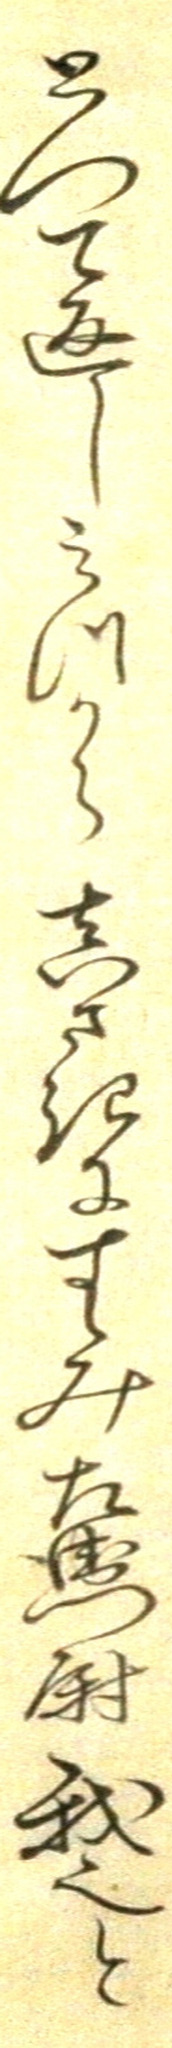とつて返しみつから真さきにすゝみ左衛門尉我也と
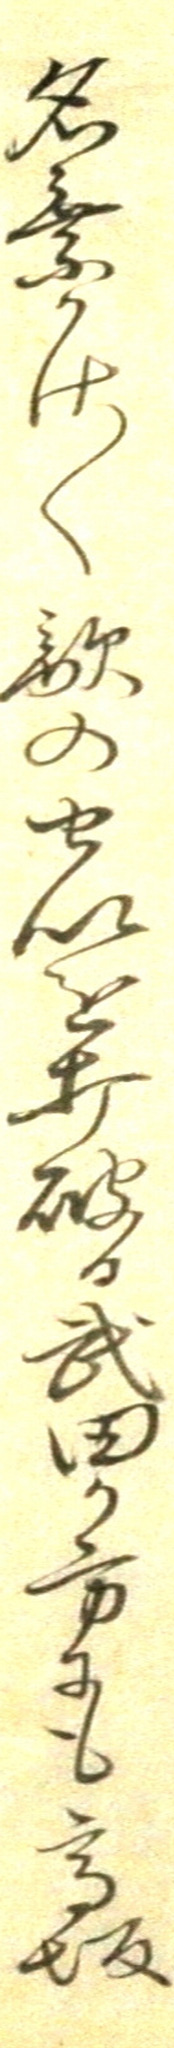名乗かけ〳〵敵のせいを打破る武田か方にも高坂
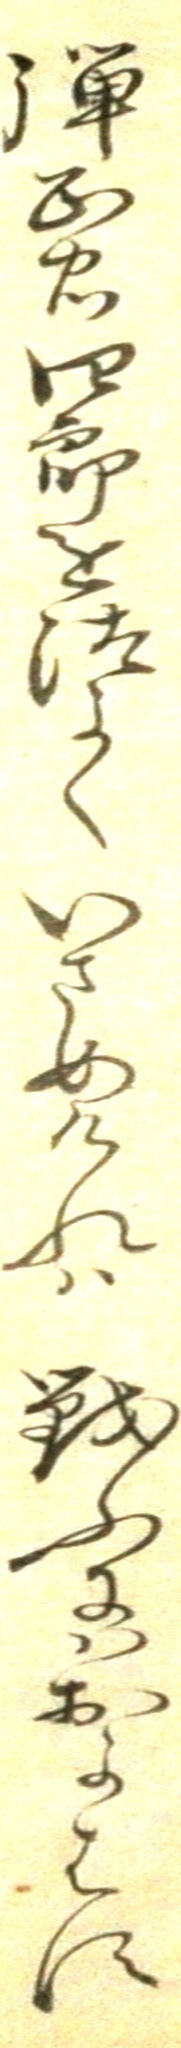弾正忠四郎をつよくいさめけれは戦ふにはおよはす
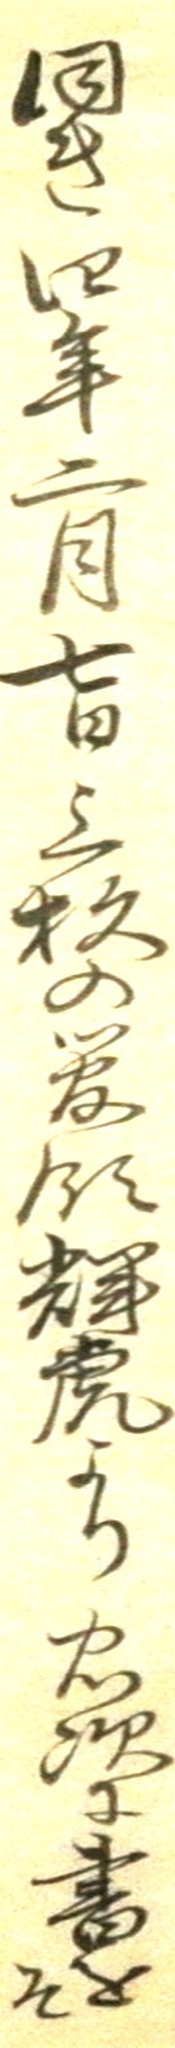同き四年二月七日上杉の管領輝虎より忠次に書をそ
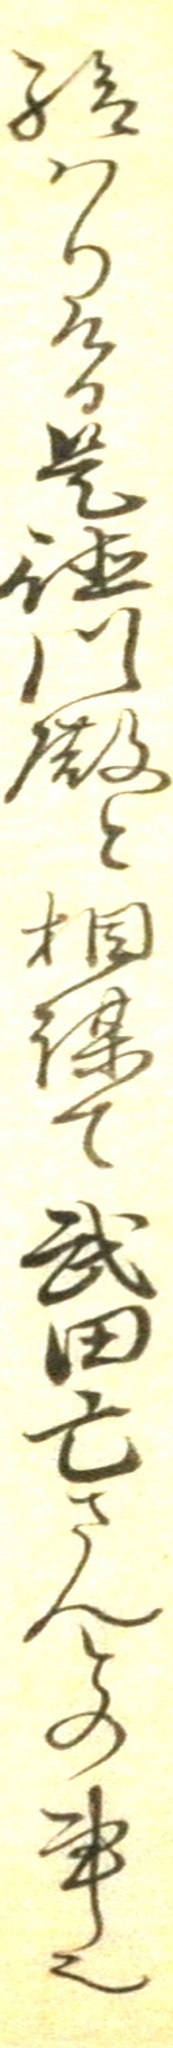給はりける是徳川殿と相謀て武田亡さんとの事也
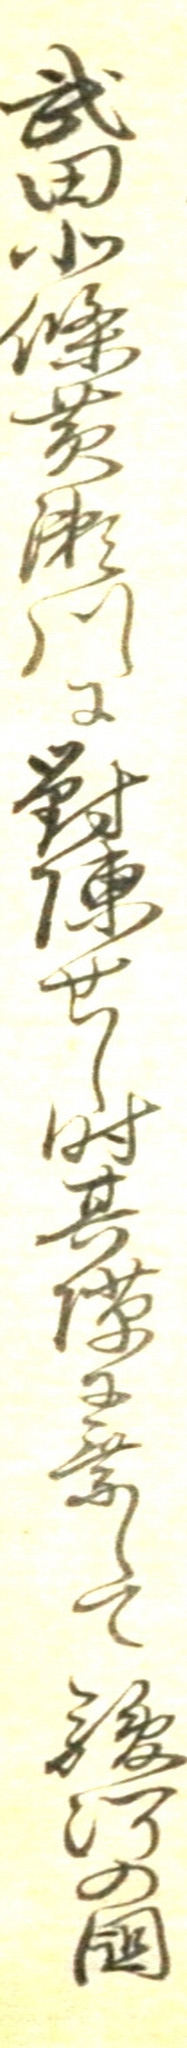武田北条黄瀬川に対陣せし時其陣に乗して駿河の国
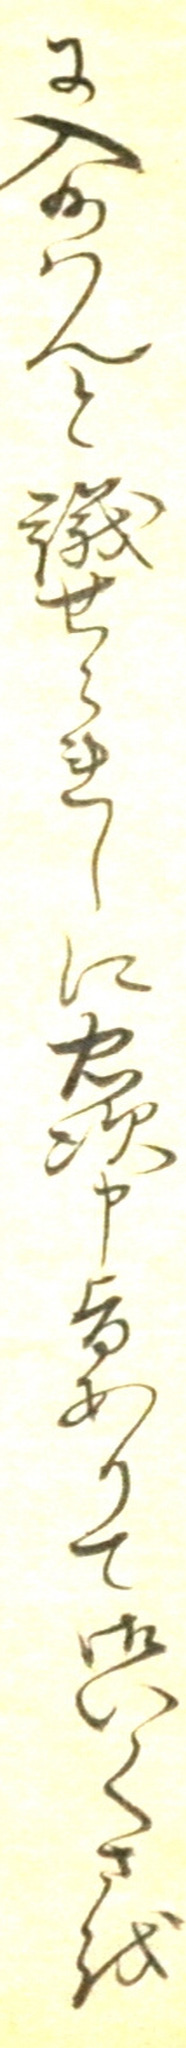に入給はんと議せられしに忠次申旨ありて御いくさを
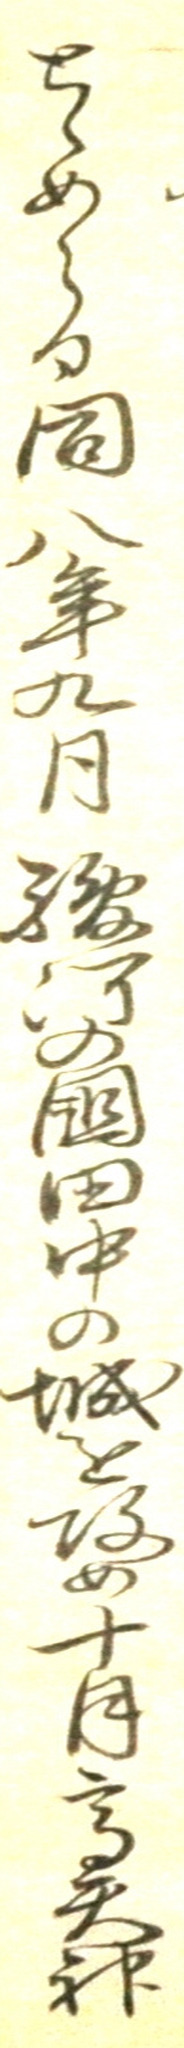とゝめらる同八年九月駿河の国田中の城を攻め十月高天神
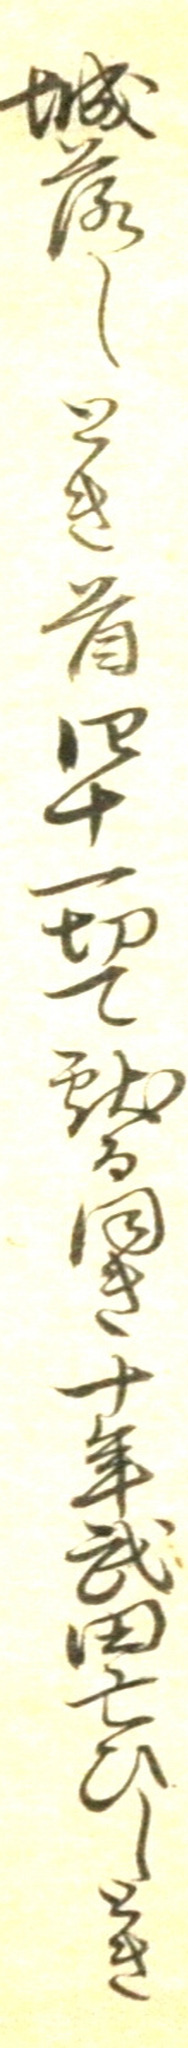城落しとき首四十一切て献る同き十年武田亡ひしとき
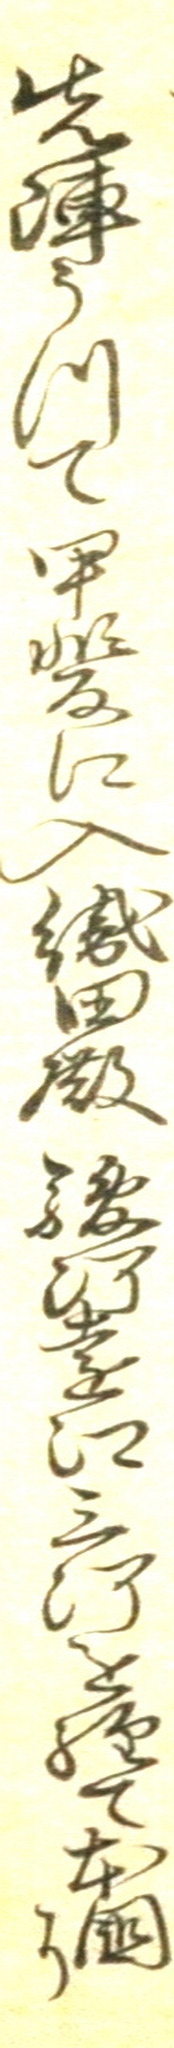先陣うつて甲斐に入織田殿駿河遠江三河を経て本国に
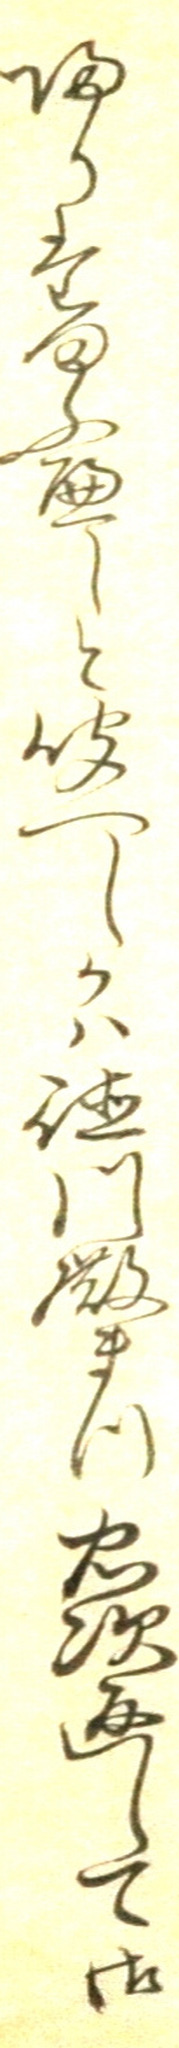帰りたまふへしと聞へしかは徳川殿まつ忠次返して御
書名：藩翰譜（四・上）
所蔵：伊那市立高遠町図書館・合同会社AMANE
